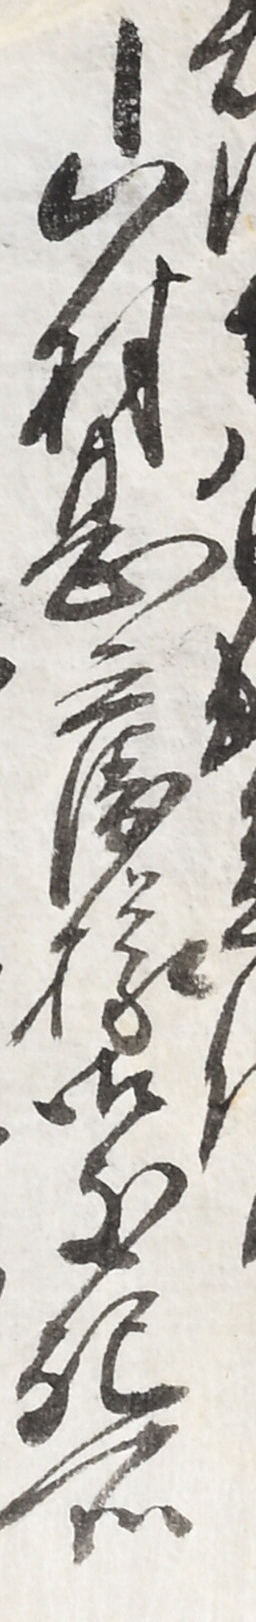山村甚兵衛様御支配所
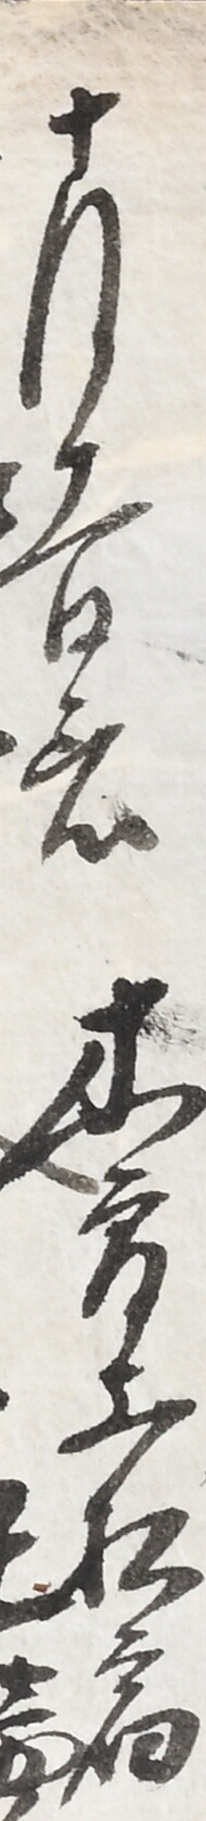十月十一日着木曽上松宿
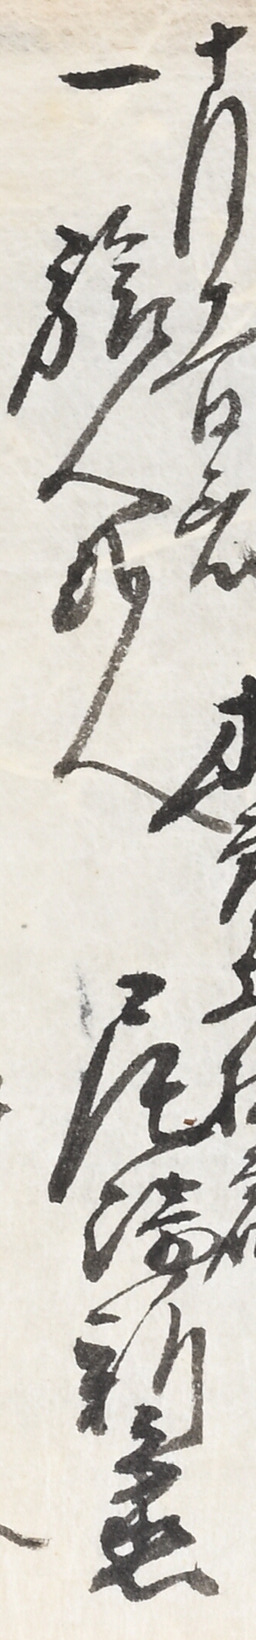一旅人弐人尾崎新之丞
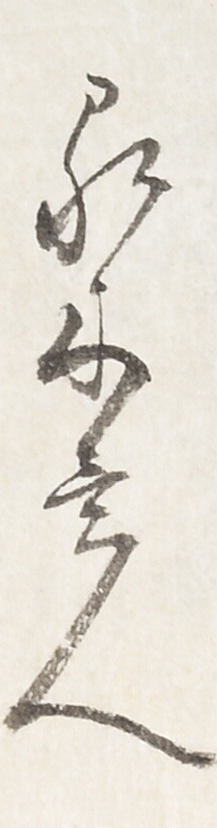家来壱人
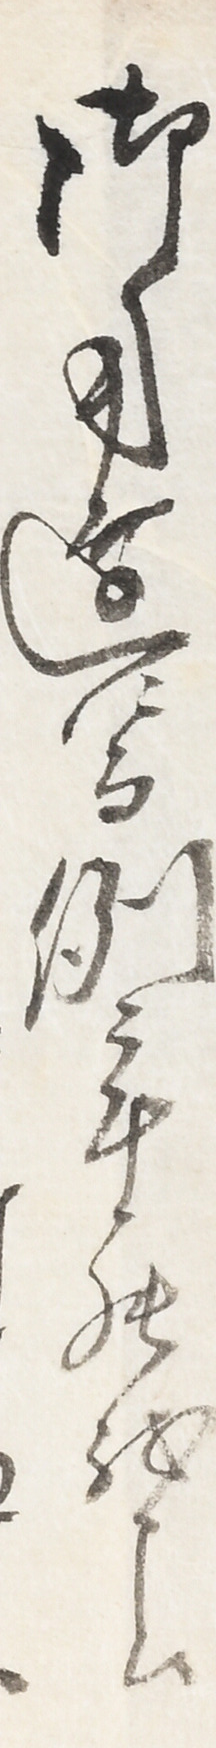御用達ニ而例年罷越申候
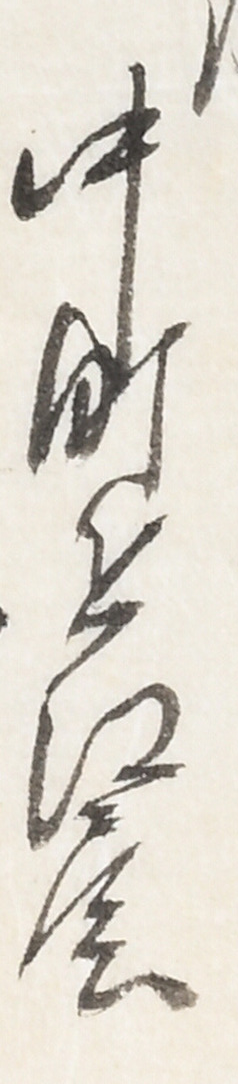中町近江屋
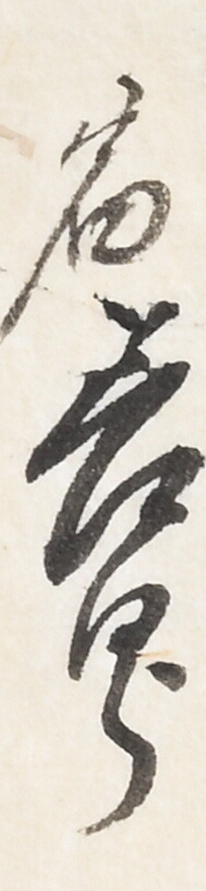宿善四郎
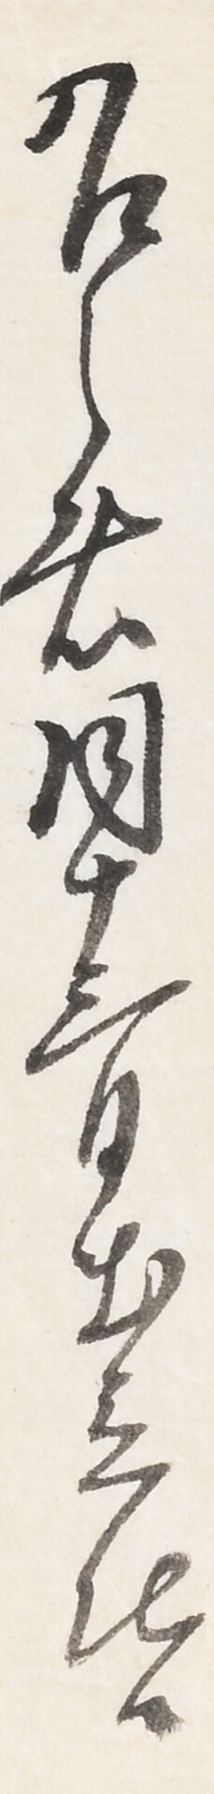右之者同十三日出立仕候
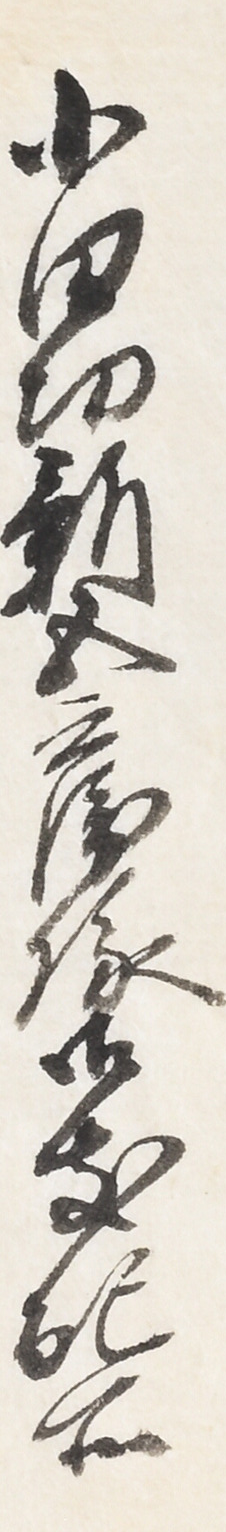小田切新五兵衛様御支配所
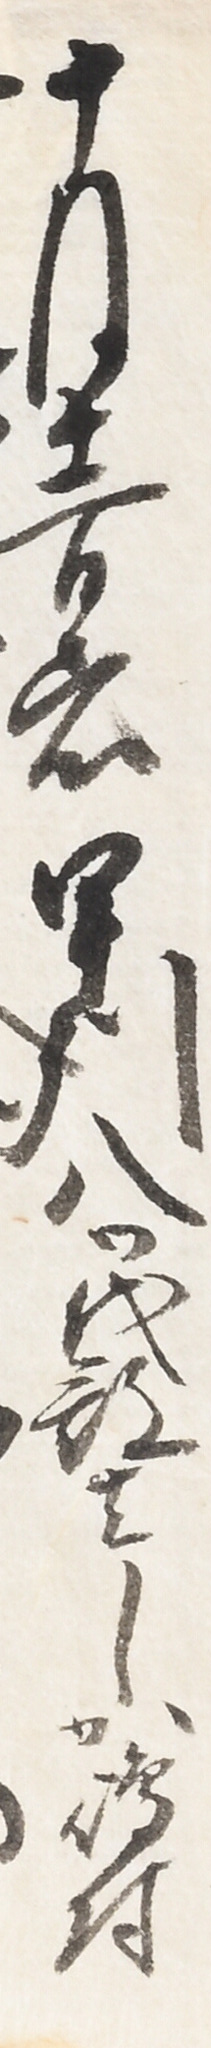十月十二日着甲州八ツ代郡はしか嶋村
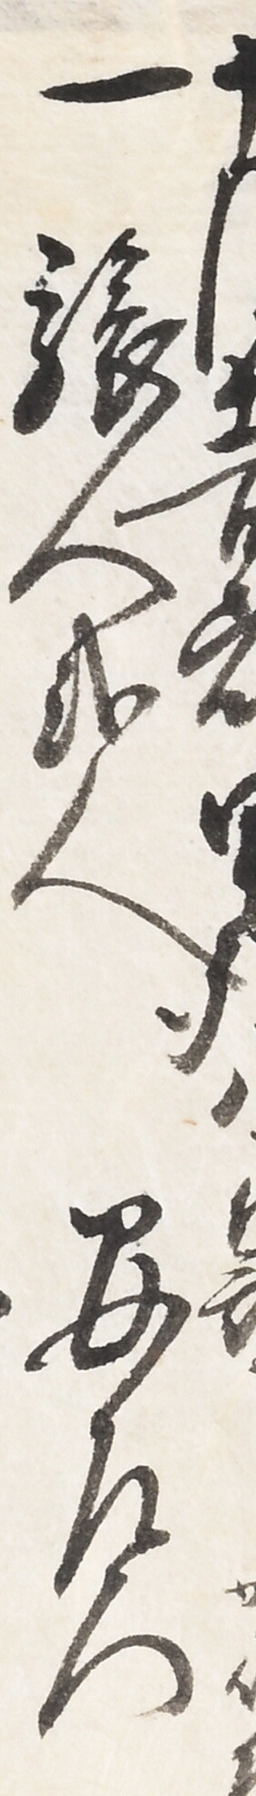一旅人弐人安左衛門
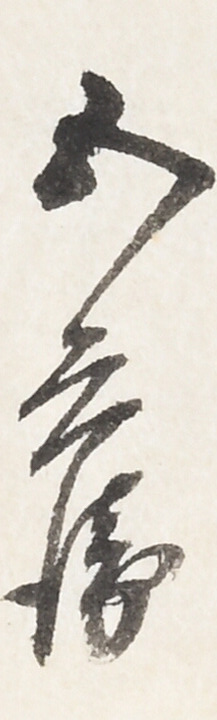五兵衛
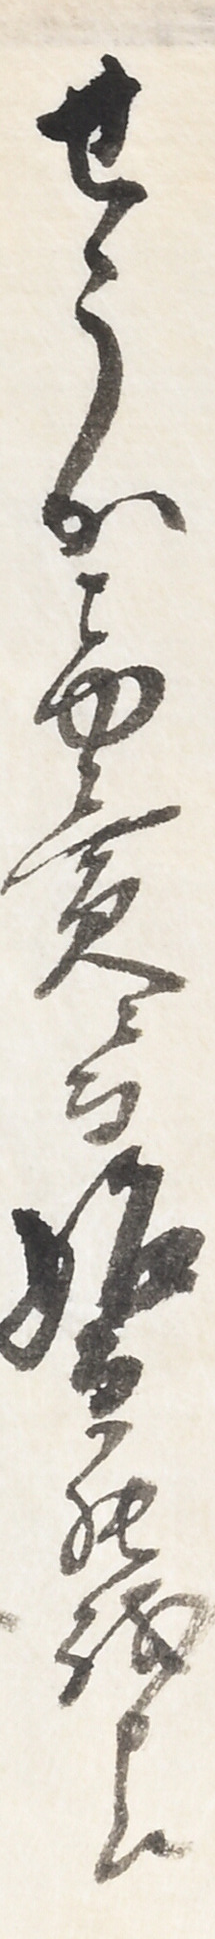せうか商売ニ而始而罷越申候
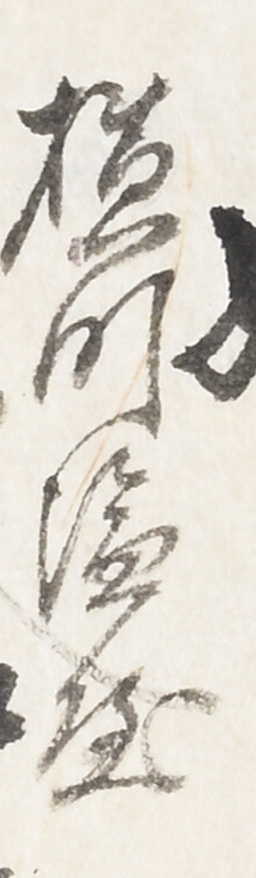横町塩屋
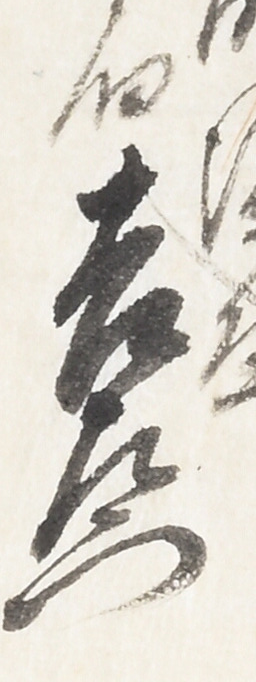宿吉左衛門
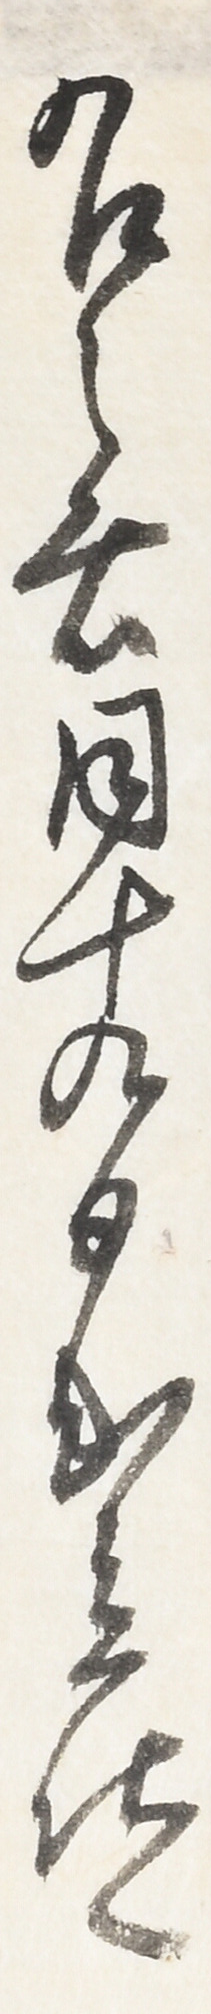右之者同十九日出立仕候
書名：旅人泊控帳
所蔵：伊那市立高遠町図書館・合同会社AMANE
